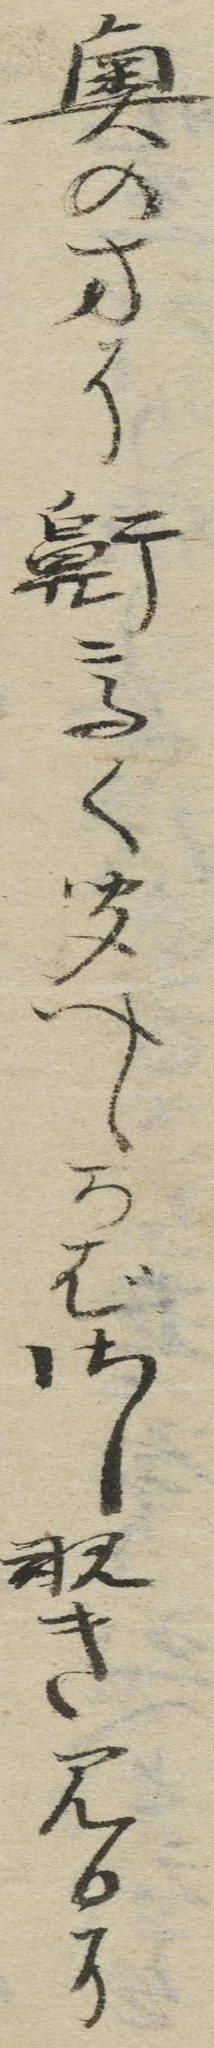奥の方に鼾高く聞へしかばさし覗き見るに
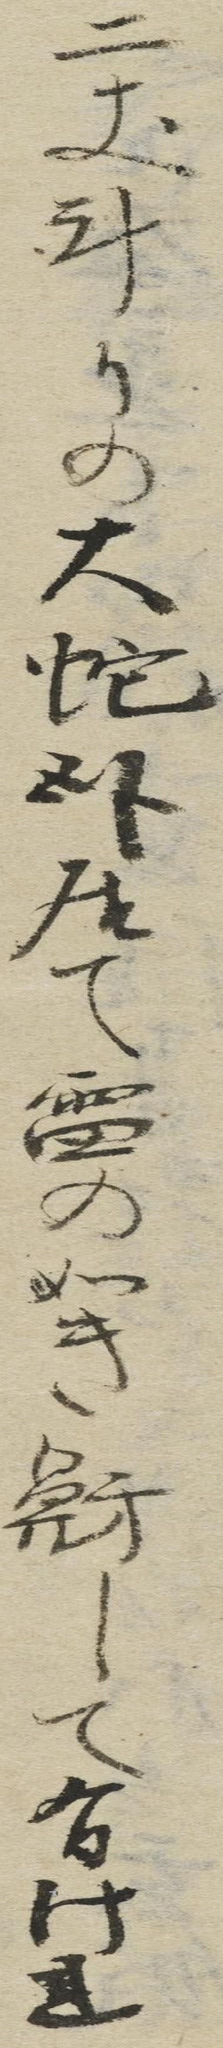二丈計りの大蛇臥居て雷の如き鼾して有けれ
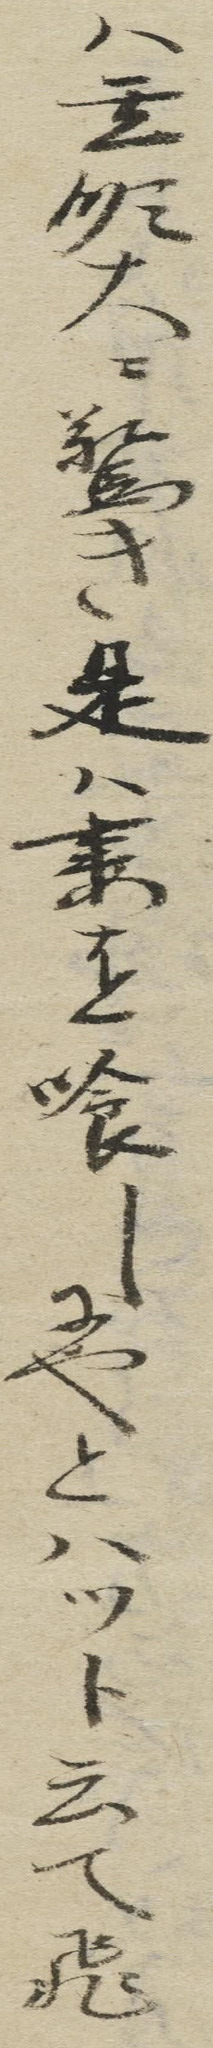ハ玄順大ニ驚き是は妻を喰しにやとハット云て飛
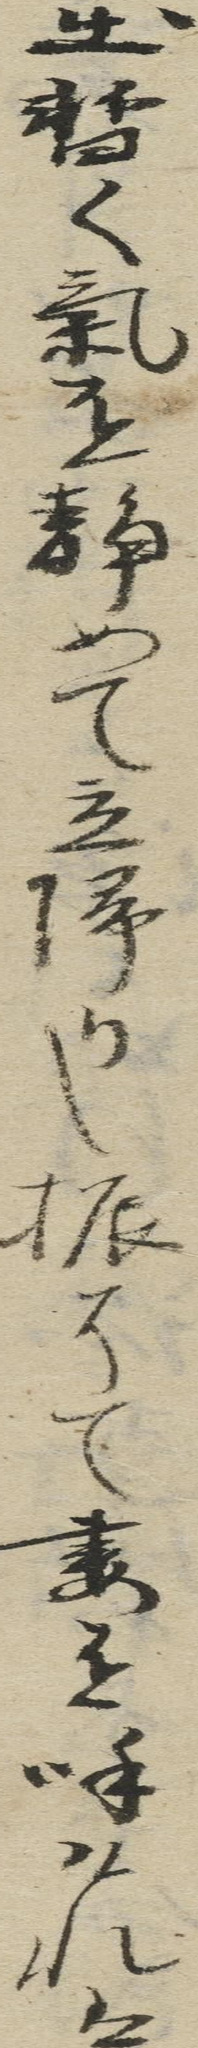出暫く気を静めて立帰りし振にて妻を呼けれは
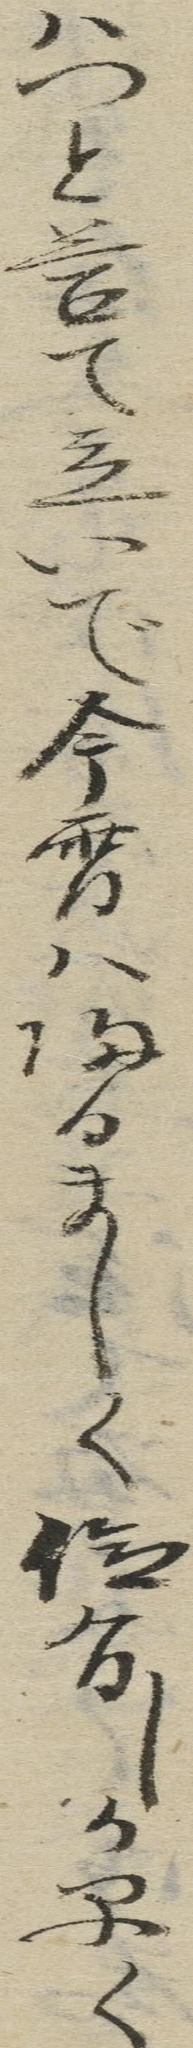ハつと答て立いで今宵は帰るましく仰有しか早く
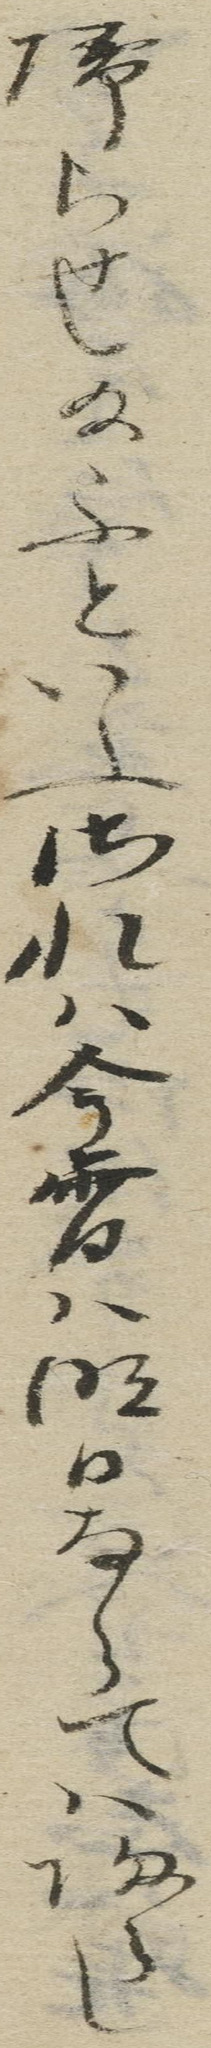帰らせ給ふといふされハ今宵ハ明日ならでハ帰らし
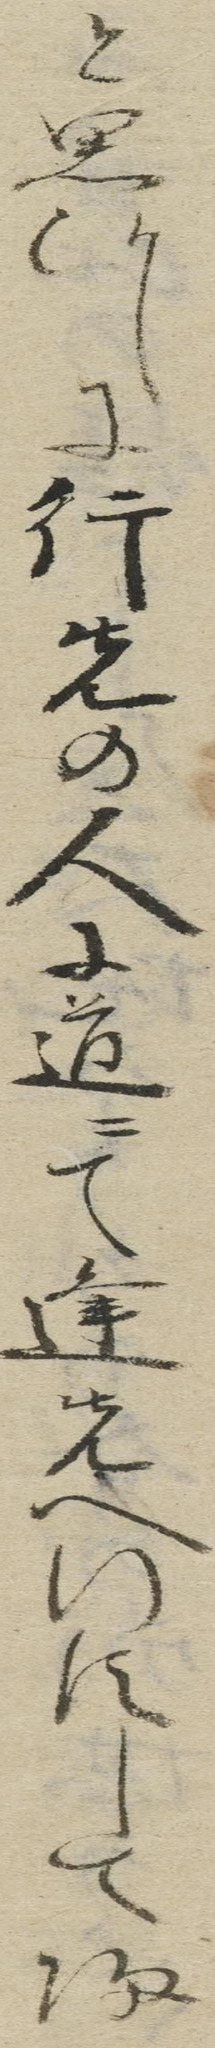と思ひしに行先の人に道ニて逢先へ行すして帰
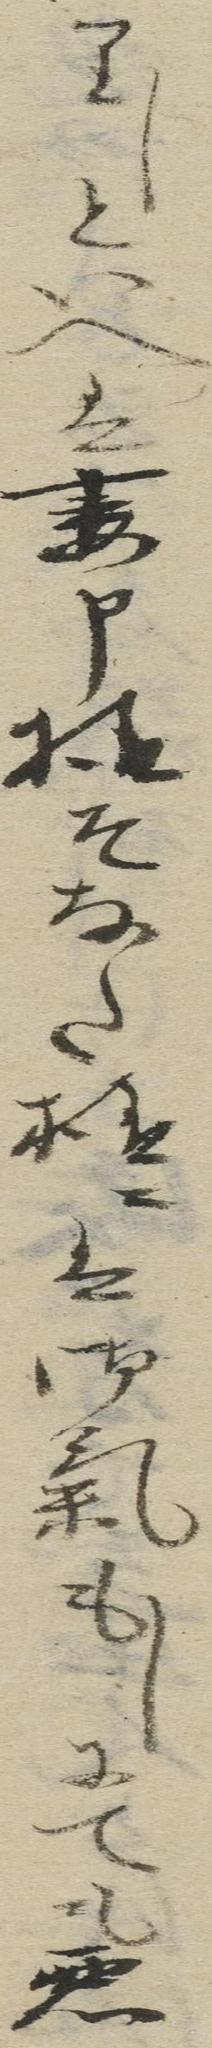りしといへは妻申様そなた様には御気もしにても悪
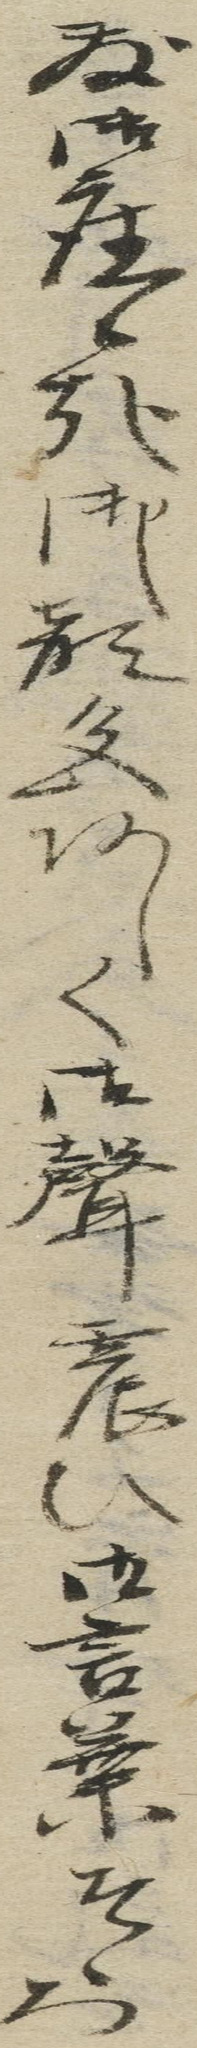敷御座候哉御顔色あしく御声震ひ御言葉はそゝろ
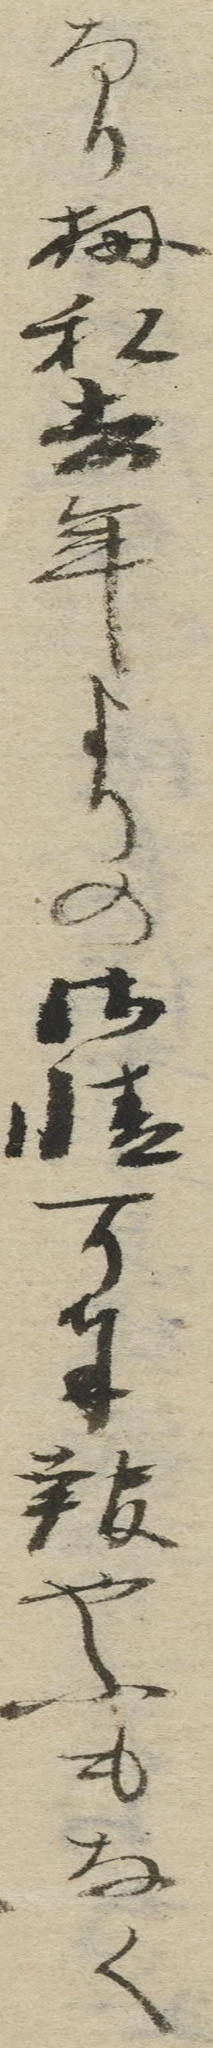なり扨私去年よりの御情可奉報やふもなく
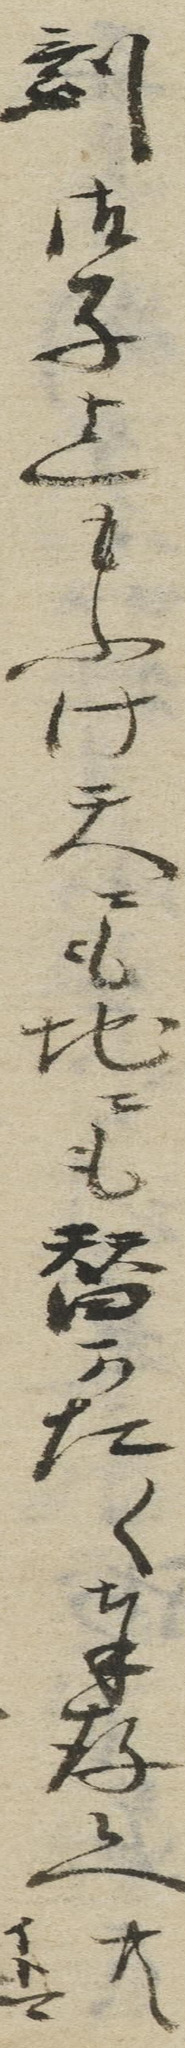剩御子までもふけ天ニも地ニも替かたく奉存候へ共
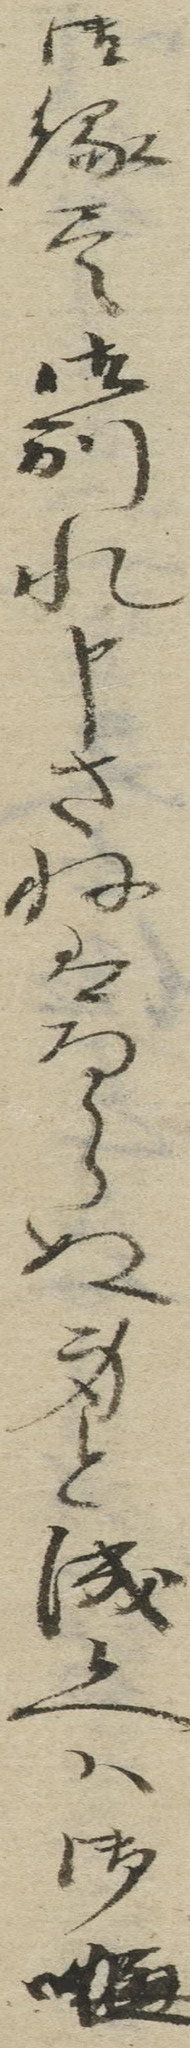御縁尽御別れ申さねはならぬ身と成候へハ御暇
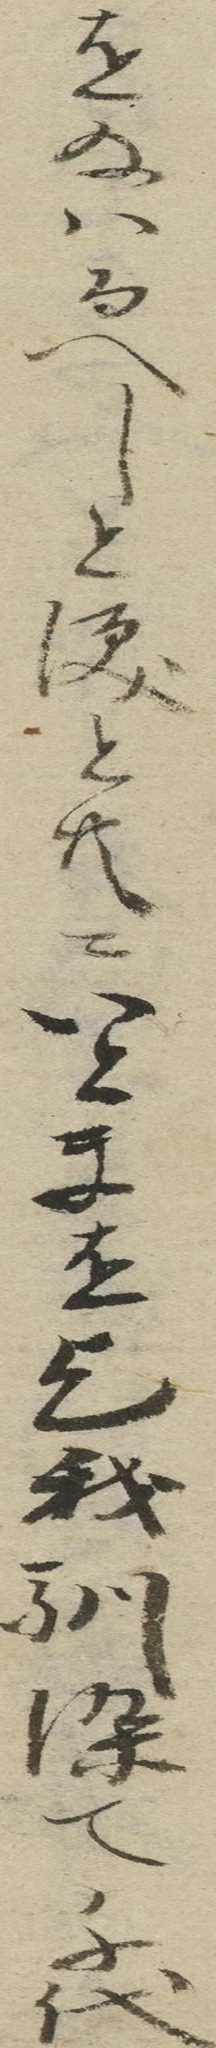を給はるへしと涙と共にいとまを乞我馴染て千代
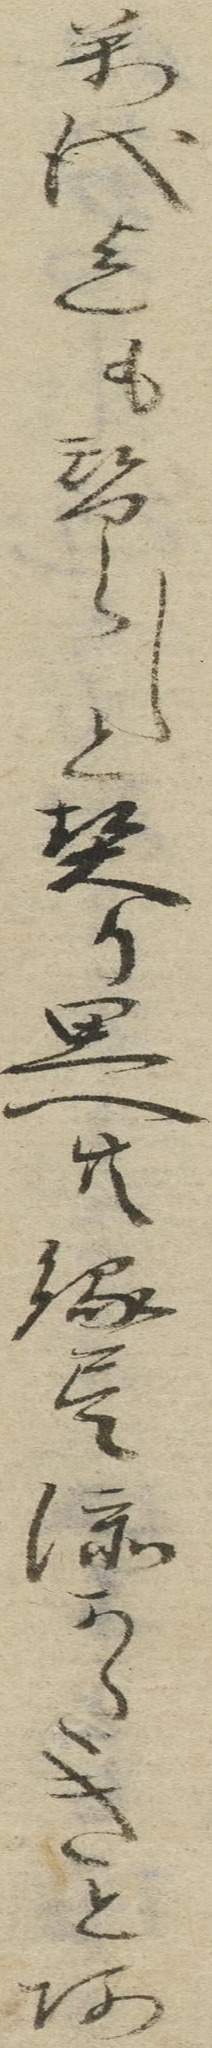万代迄も替らしと契り思へ共縁尽添かたきとあ

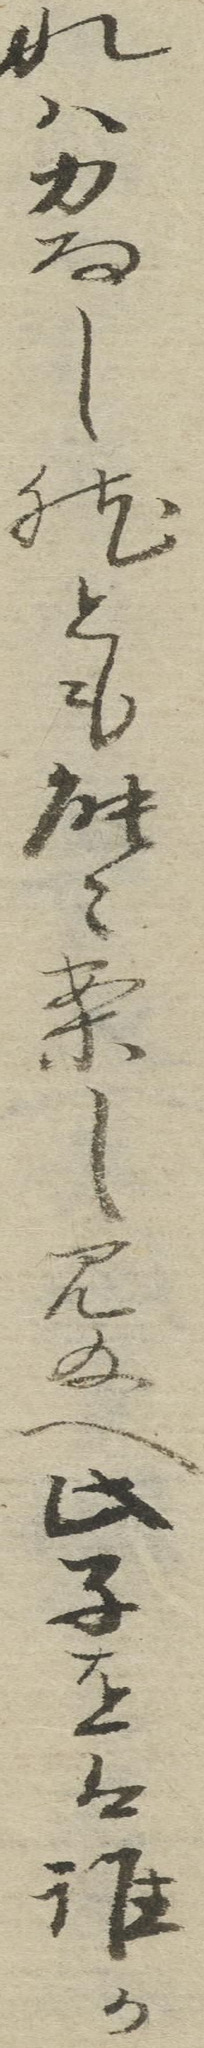れハ力なし然とも能〻案し見給へ此子をは誰か
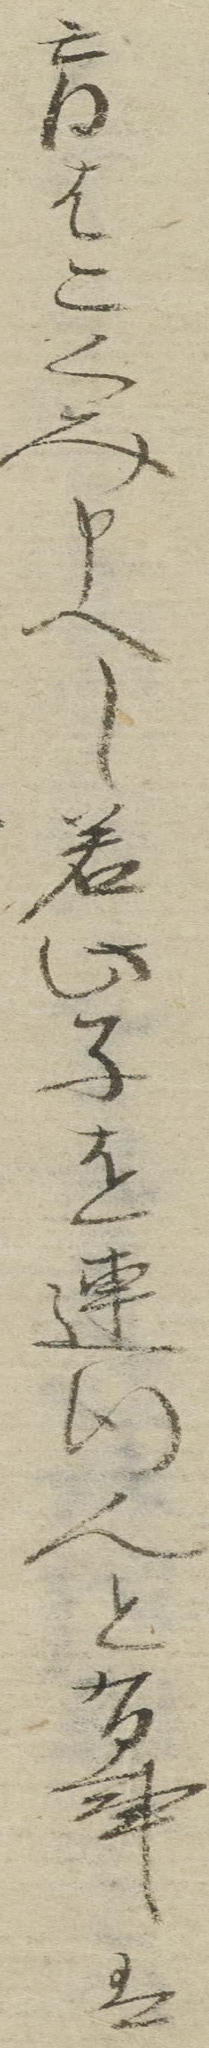育はこくみ申へし若此子を連行んと有事は
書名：肥前國島原領普賢山大変記　完
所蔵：東京大学地震研究所図書室 Earthquake Research Institute Library, The University of Tokyo, JAPAN
